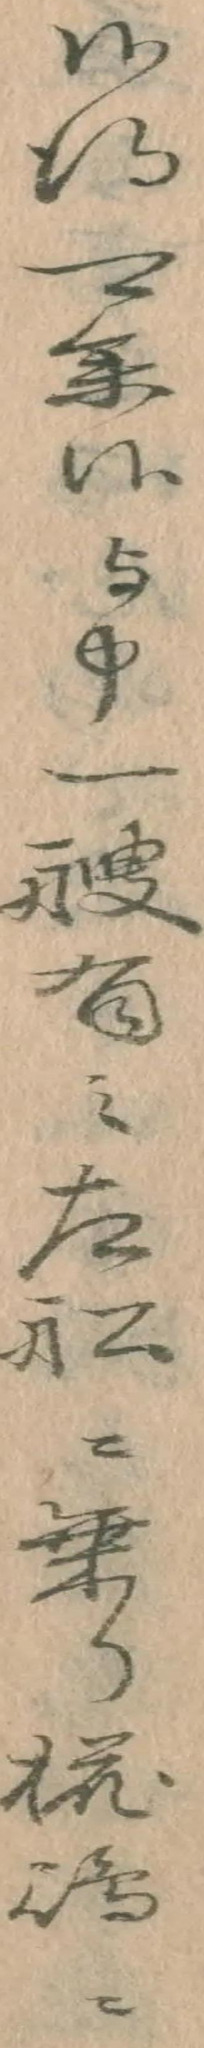候得可参候と申一艘有之左船に乗り椛島に
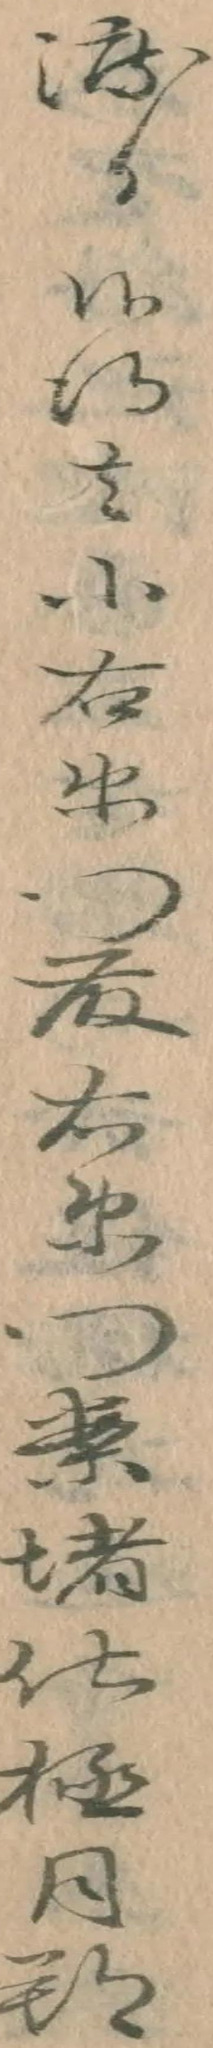渡り候得は小右衛門藤右衛門案堵仕極月朔
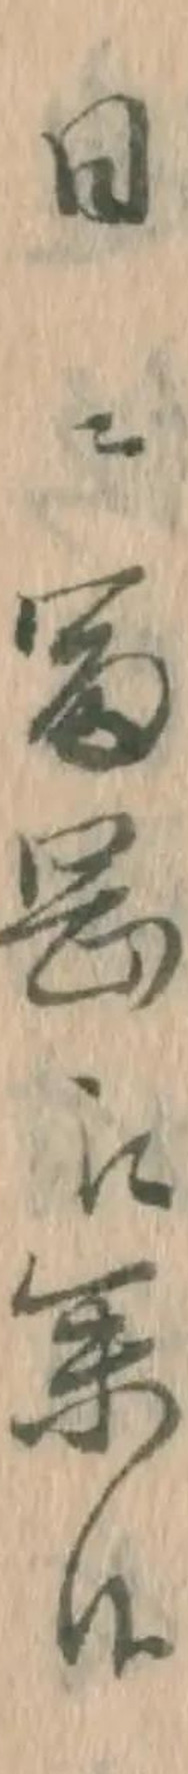日に富岡江参候
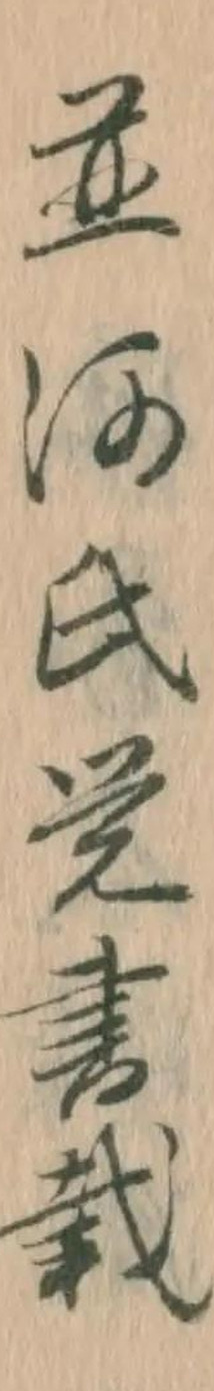並河氏覚書載
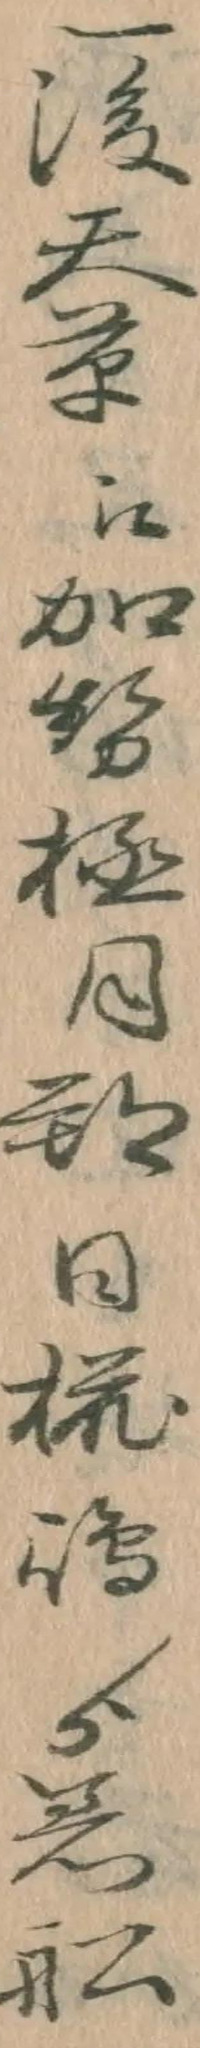一後天草江加勢極月朔日椛島ゟ着船
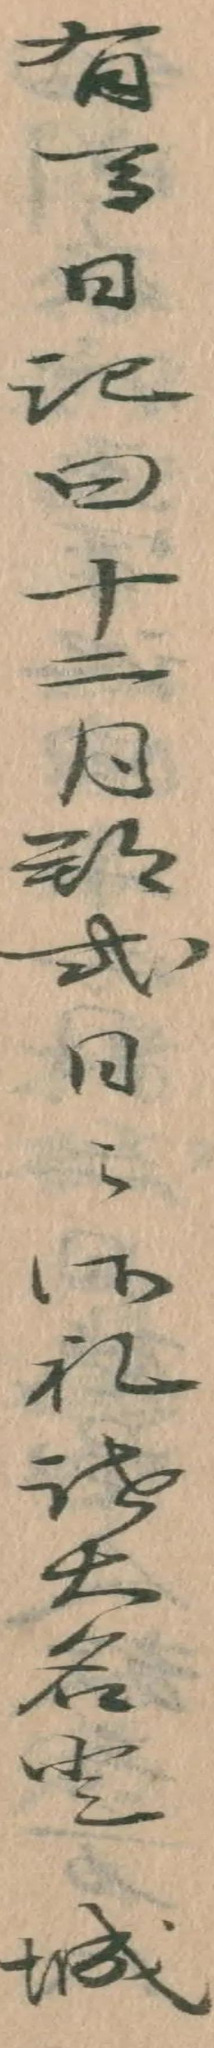有馬日記曰十二月朔式日之御礼諸大名登城
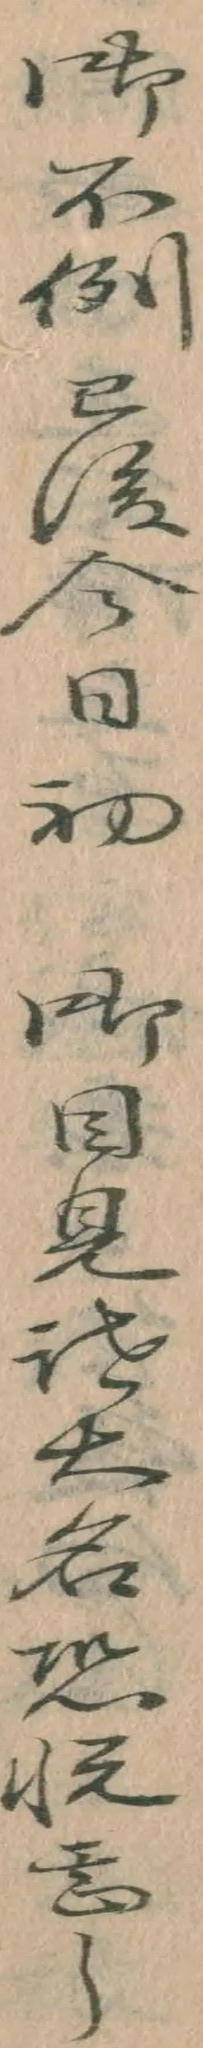御不例已後今日初御目見諸大名恐悦甚し
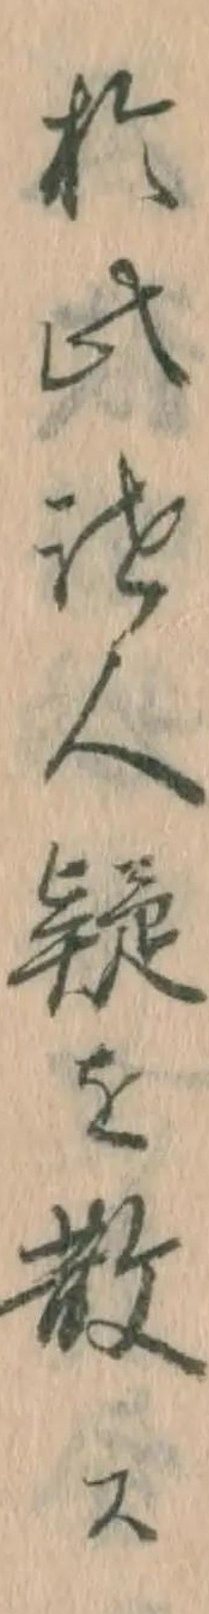於此諸人疑を散す
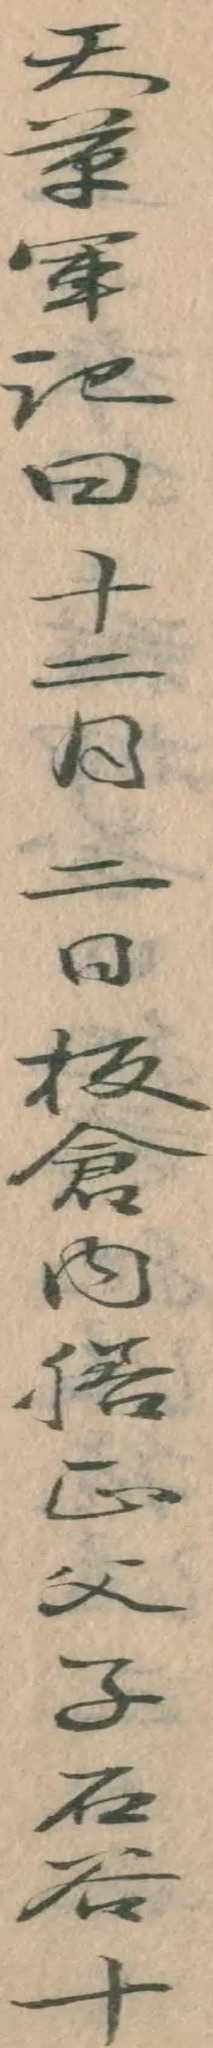天草軍記曰十二月二日板倉内膳正父子石谷十
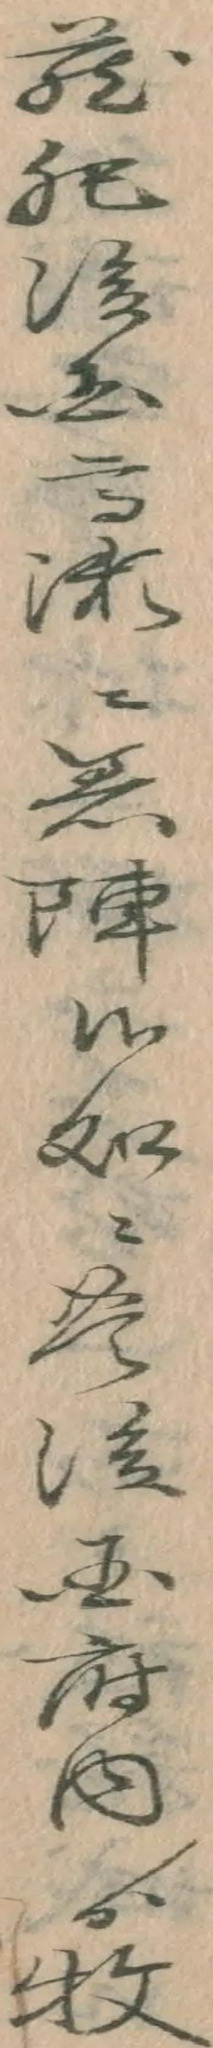蔵肥後国高瀬に着陣候処に豊後国府内ゟ牧
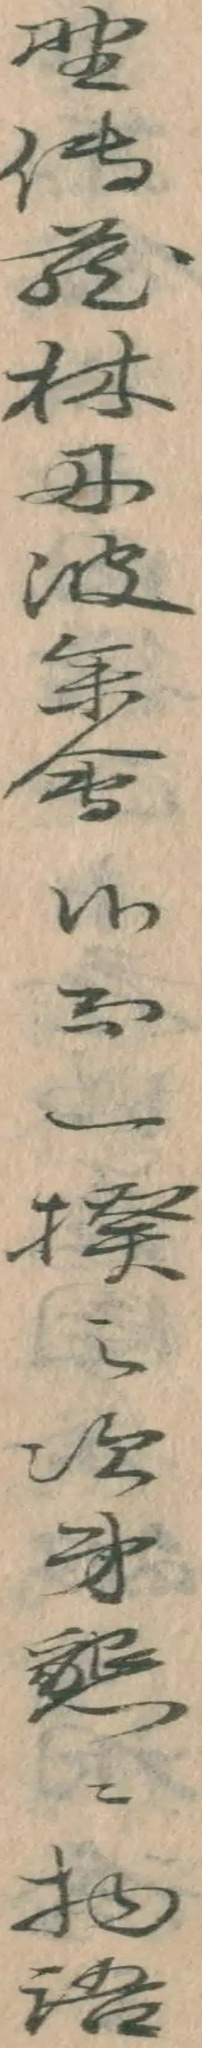野伝蔵林丹波参会候而一揆之次第懇に物語
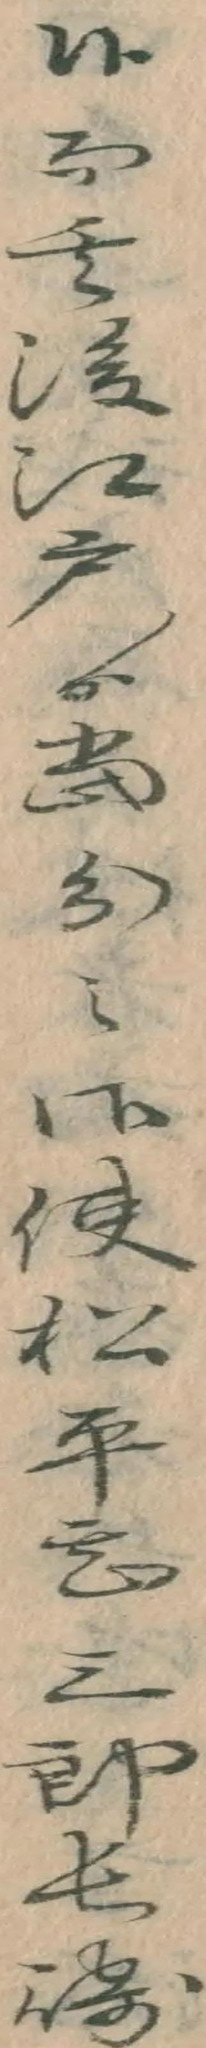候而其後江戸ゟ当分之御使松平甚三郎長崎
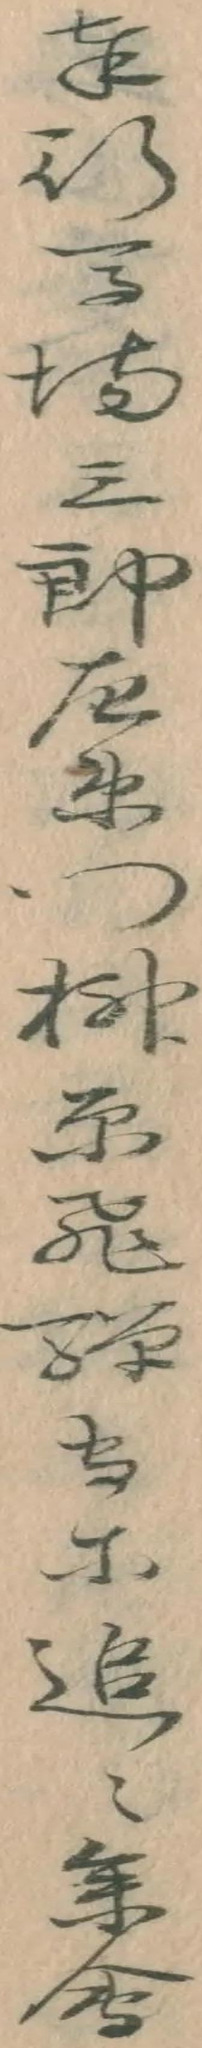奉行馬場三郎左衛門榊原飛騨守等追々参会

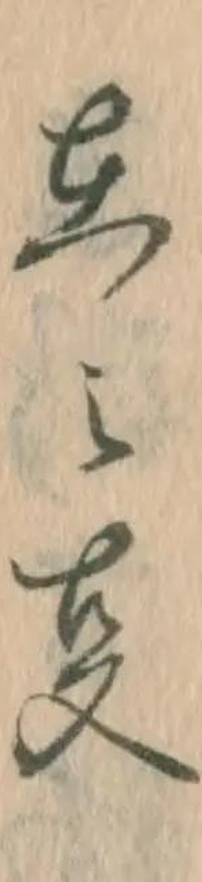在之事
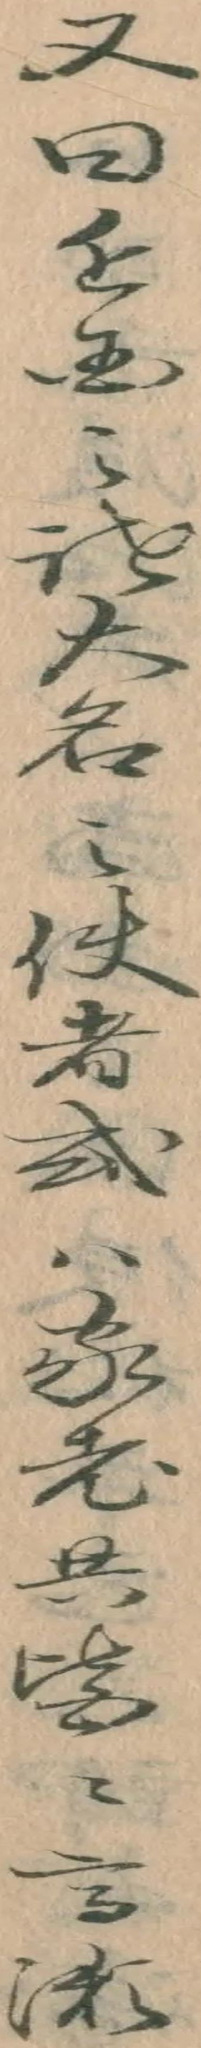又曰近国之諸大名之使者或は家老共皆々高瀬
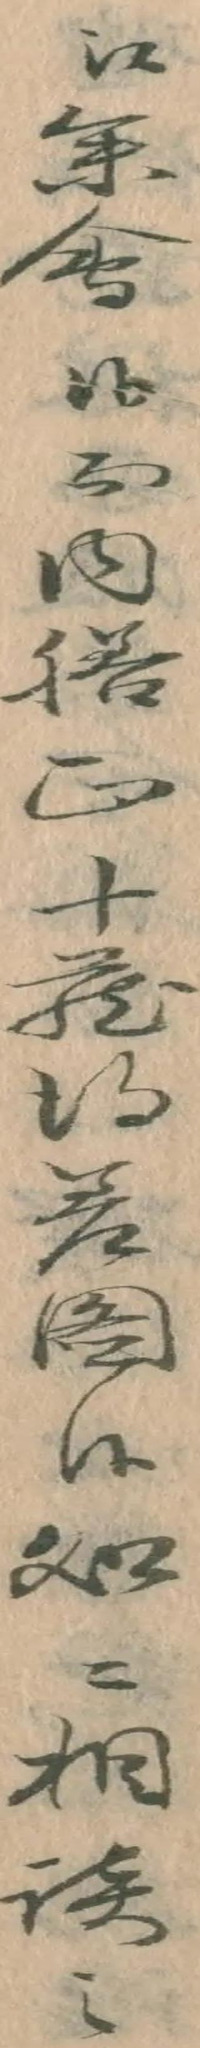江参会候而内膳正十蔵得差図候処に相談之
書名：切支丹御退治記 49巻. [3]
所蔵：国立国会図書館 National Diet Library, JAPAN
